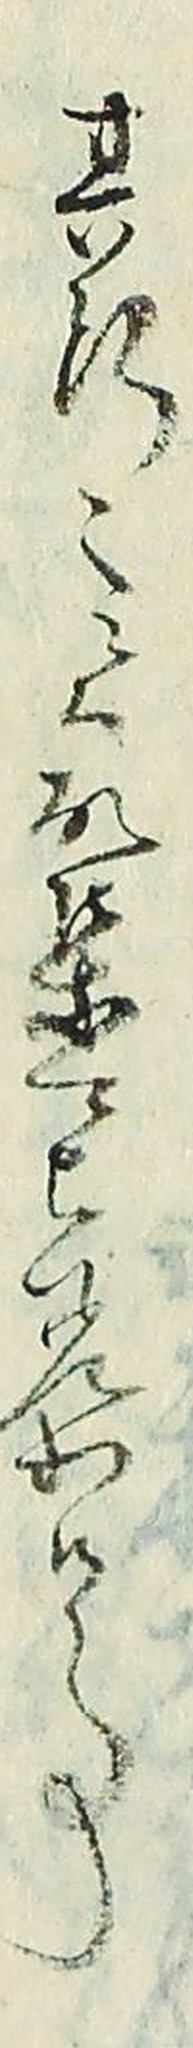其所々に候而取集可被差出候事
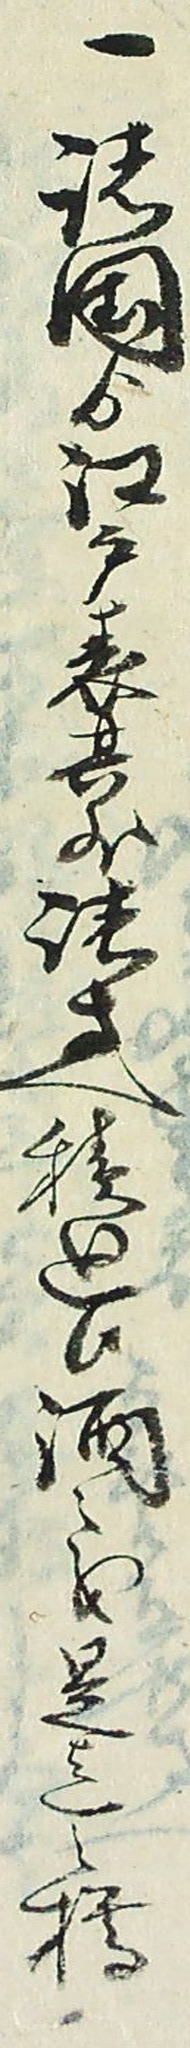一諸国ゟ江戸表其外諸方へ積廻候酒之義是迄之樽
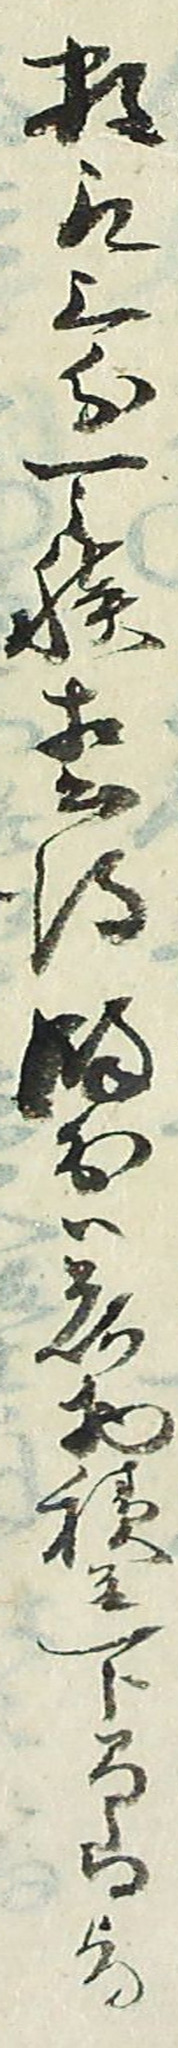数取三分一之積相心得余分は荷物積送申間布旨
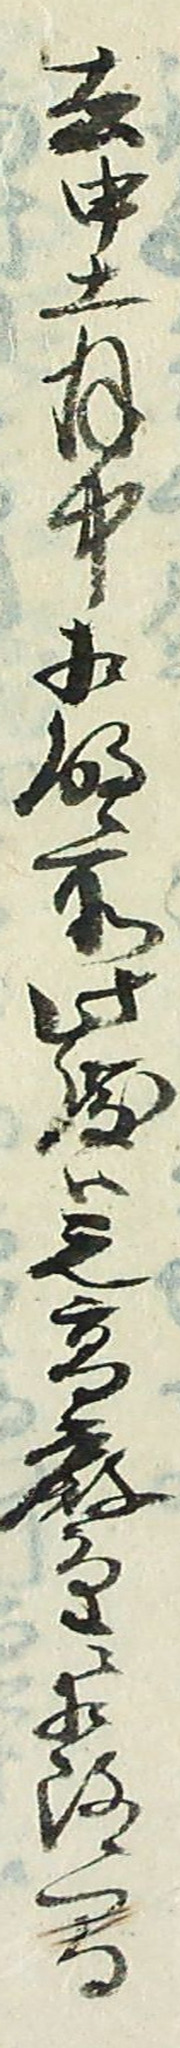去申十一月中相触候所此度は元高厳重に相改候間
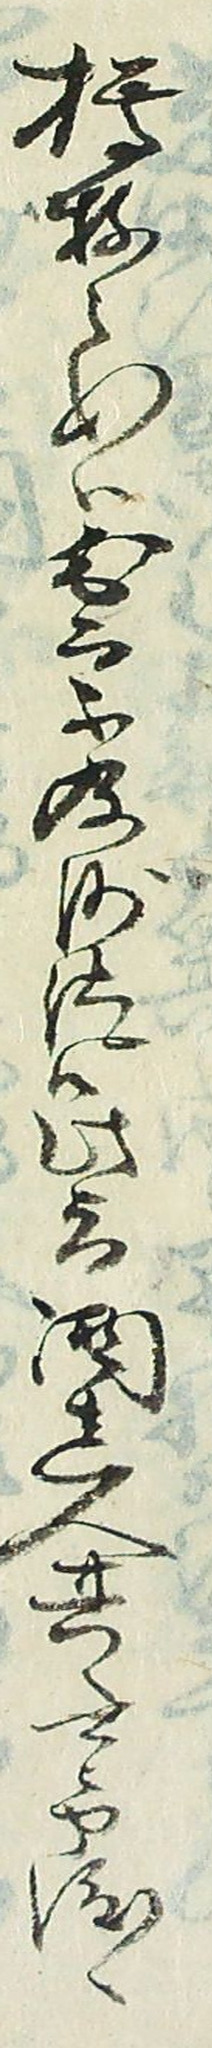樽数之義は分而不及沙汰候此旨酒造人共へ可被申渡候
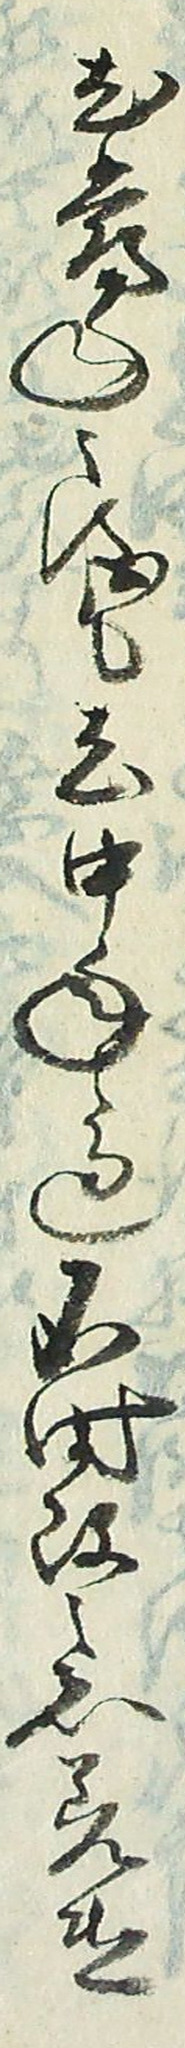尤当年之儀も去申年之通不時改之者差遣
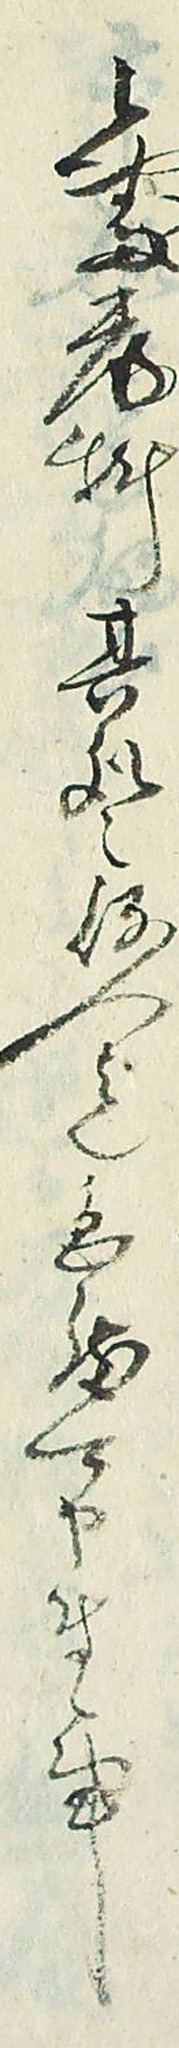被処厳科其処之役人迄急度可申付候事
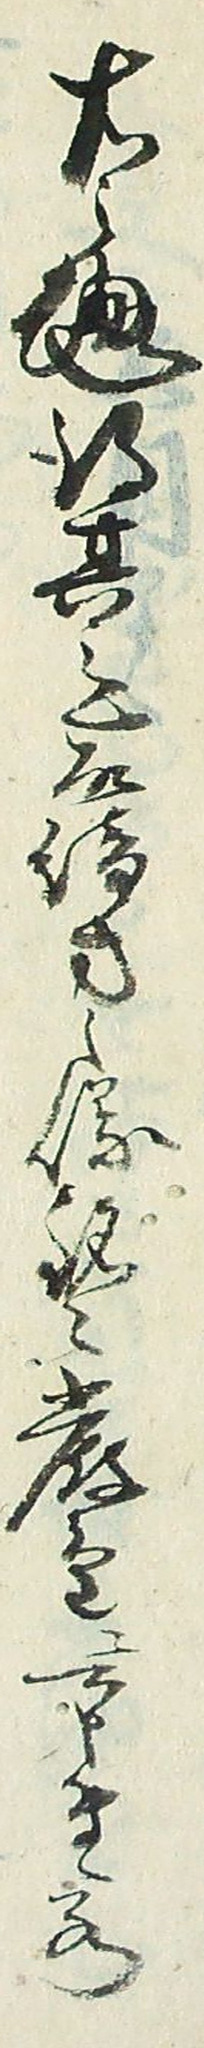右之通得其意取締方之儀銘々厳重に可申付候若
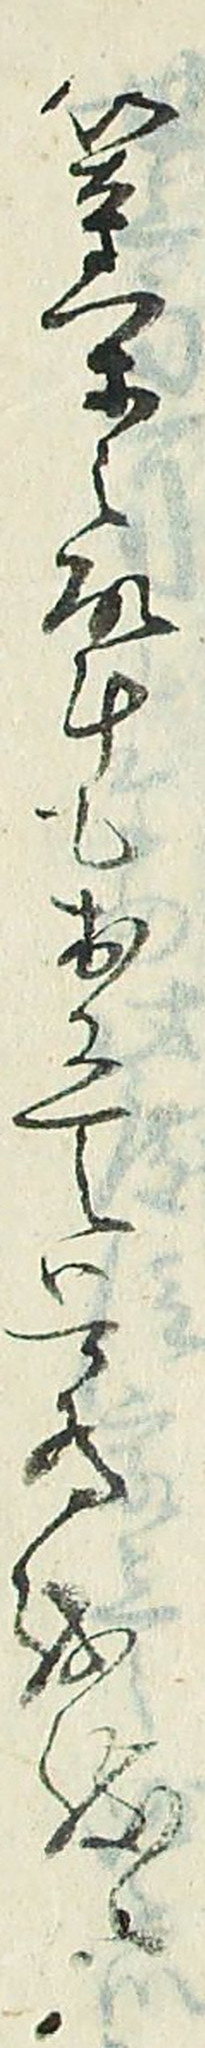等閑之取計も於有之は可為越度候

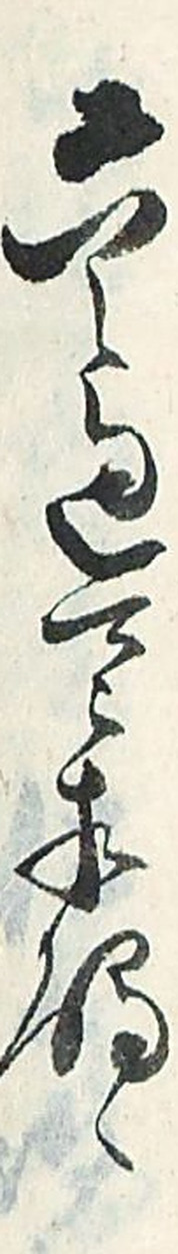右之通可相触候
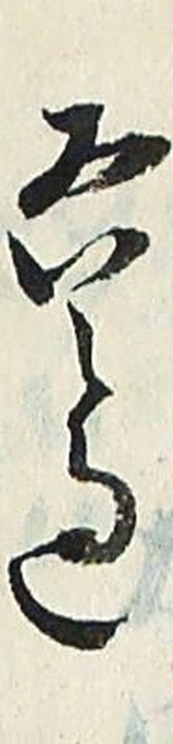右之通
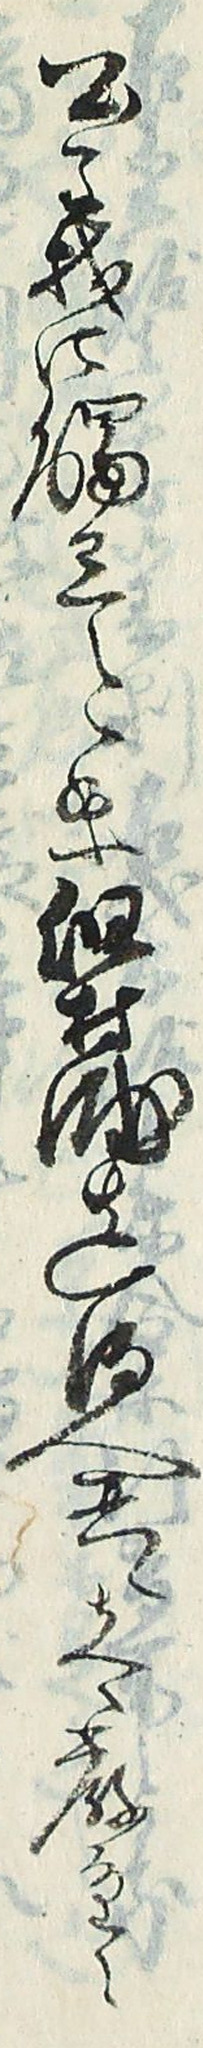公義御触有之候条組村浦造酒人共へ先々厳重に
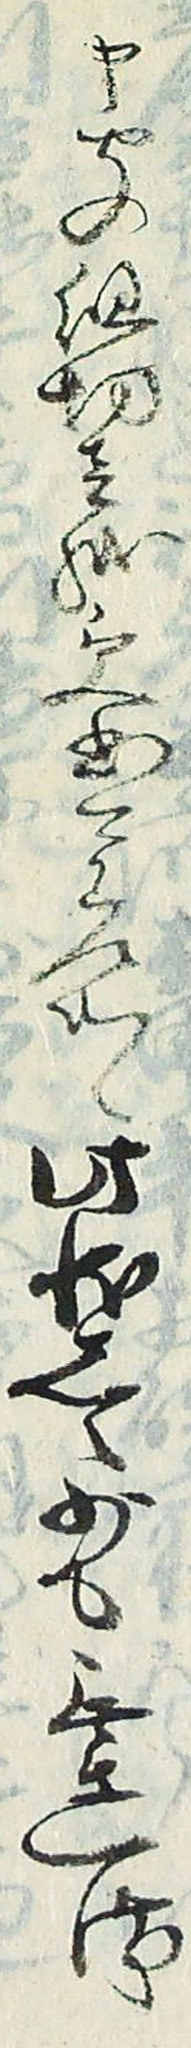申聞組切壱紙受書可差出候此状先々少も無遅滞
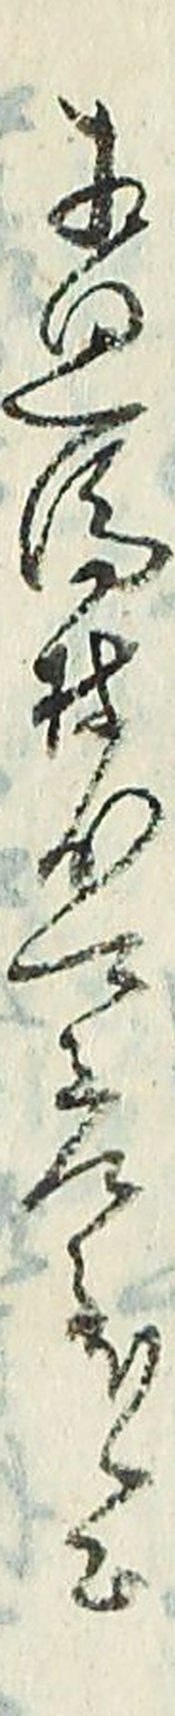相廻済村ゟ可差戻候以上
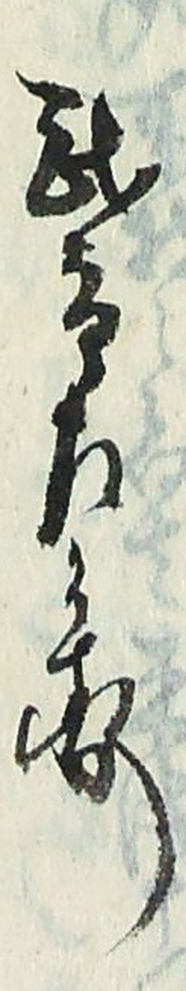武市左兵衛
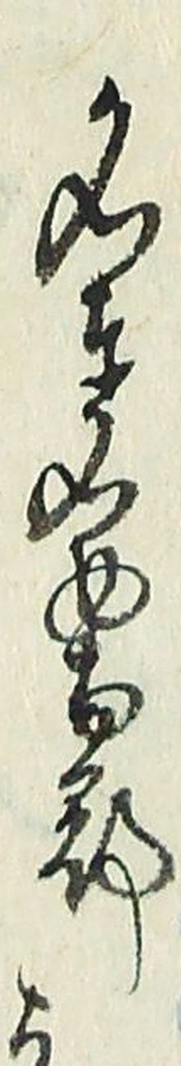名東名西両郡
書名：諸御用御□受書控
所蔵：鳴門教育大学 Naruto University of Education
